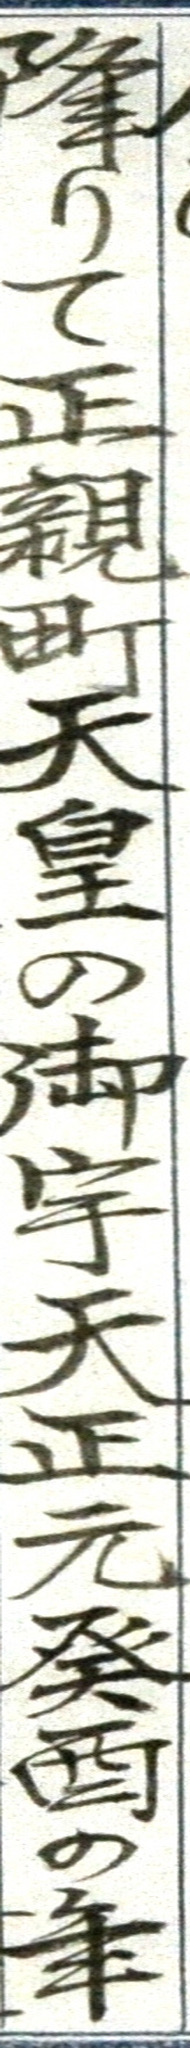降りて正親町天皇の御宇天正元癸酉の年
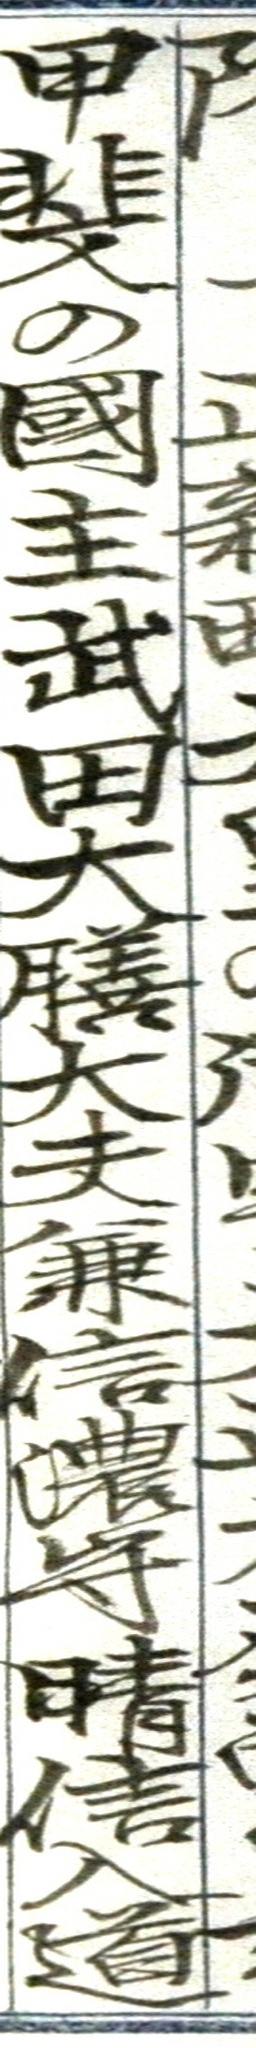甲斐の国主武田大膳大夫兼信濃守晴信入道

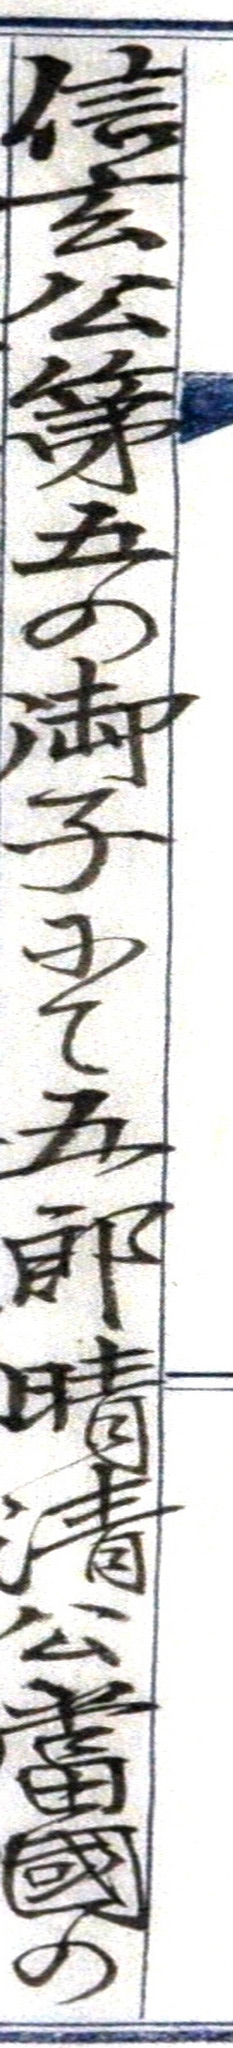信玄公第五の御子にて五郎晴清公当国の
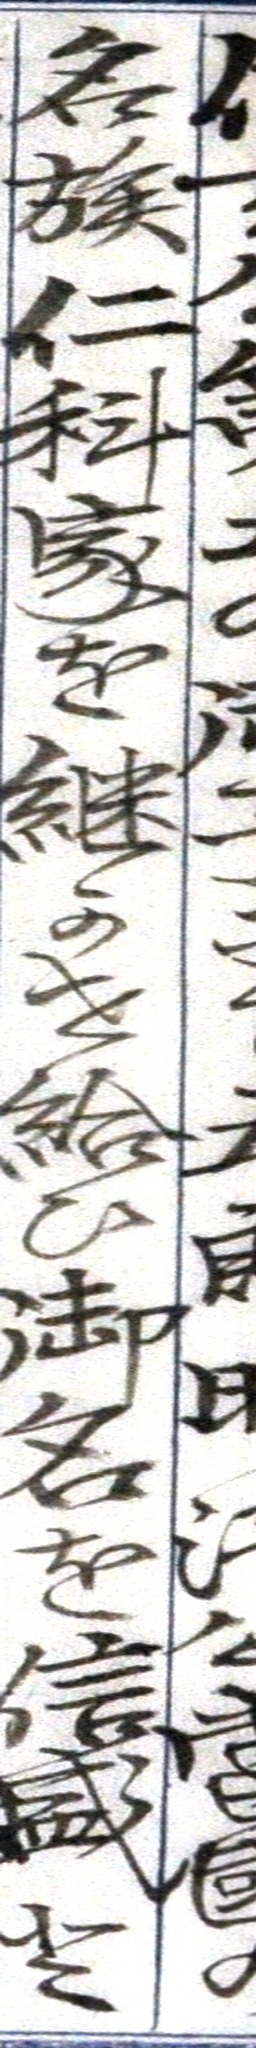名族仁科家を継かせ給ひ御名を信盛と
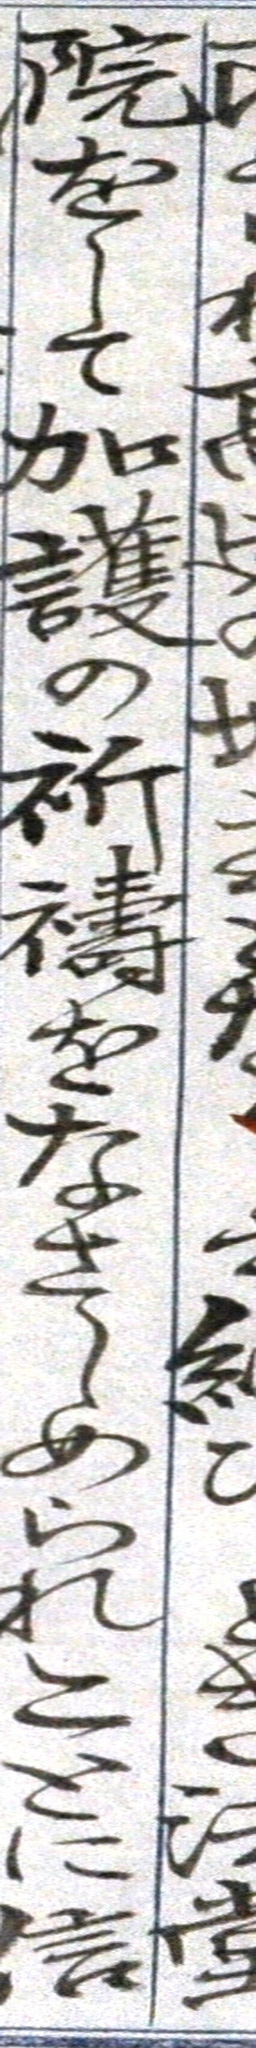院をして加護の祈祷をなさしめられことに信
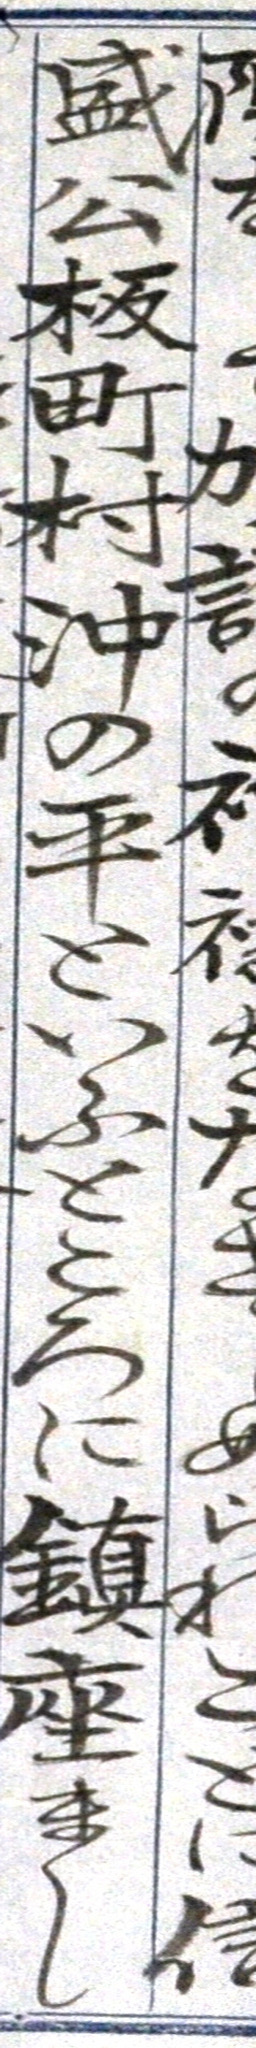盛公板町村沖の平といふところに鎮座まし
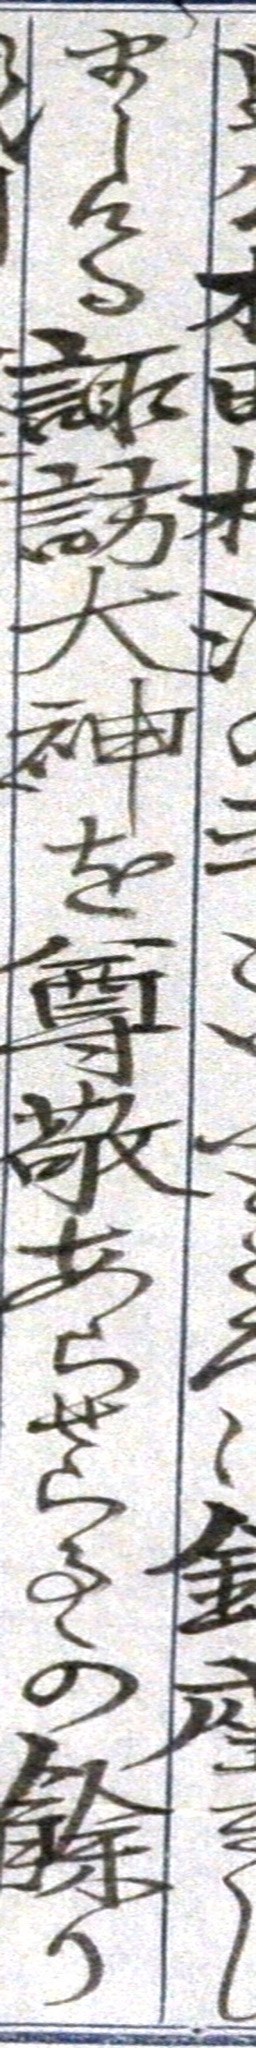ましける諏訪大神を尊敬あらせらるゝの余り
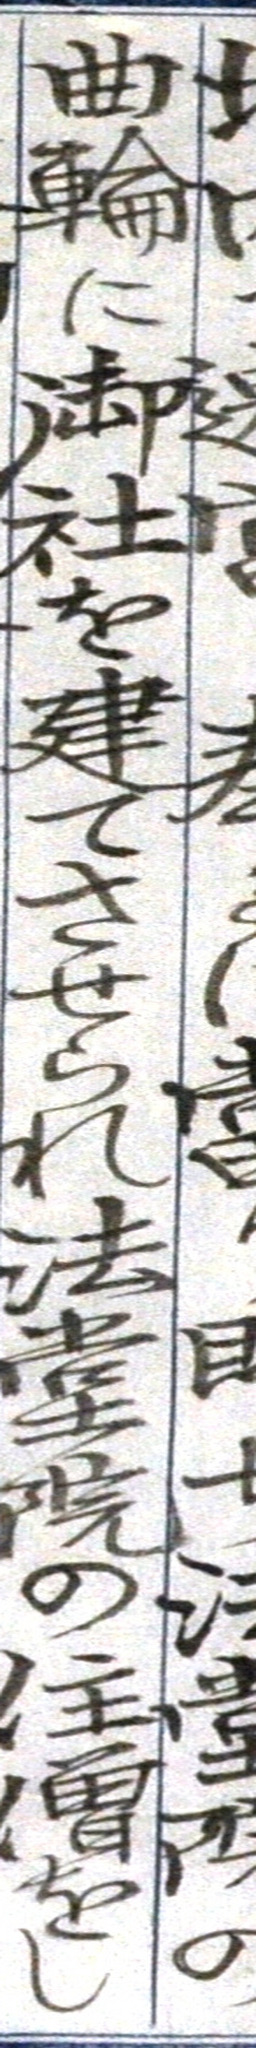曲輪に御社を建てさせられ法堂院の住僧をし
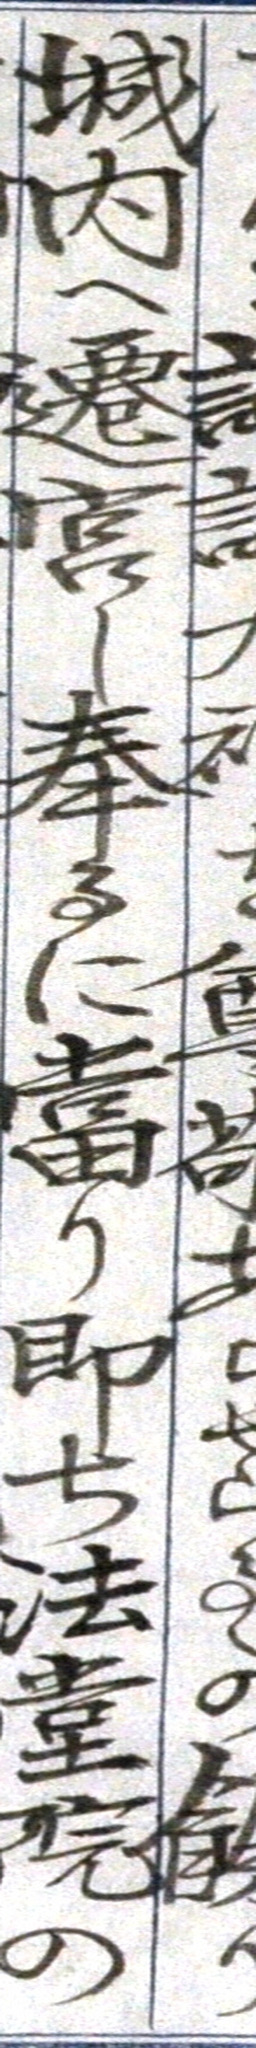城内へ遷宮し奉るに当り即ち法堂院の
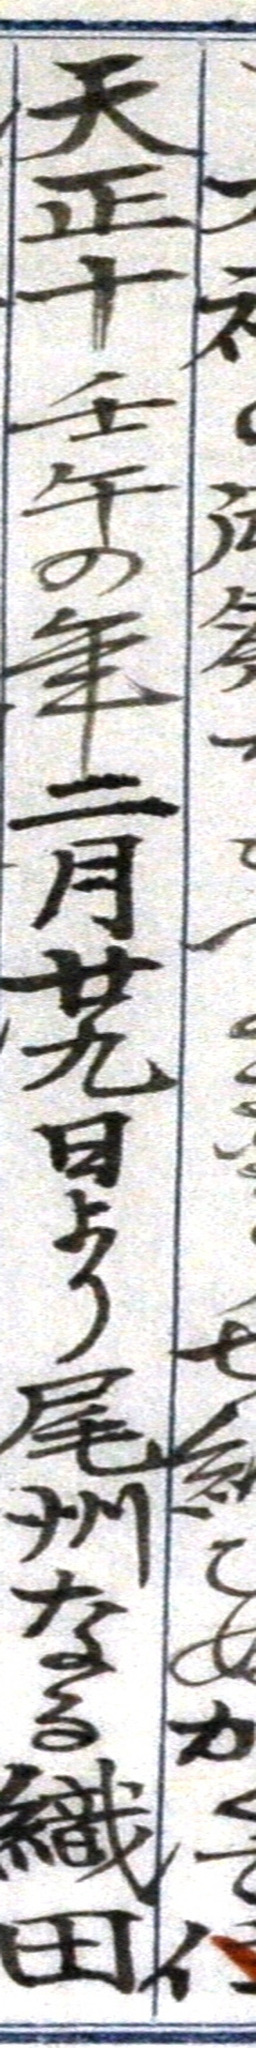天正十壬午の年二月廿九日より尾州なる織田
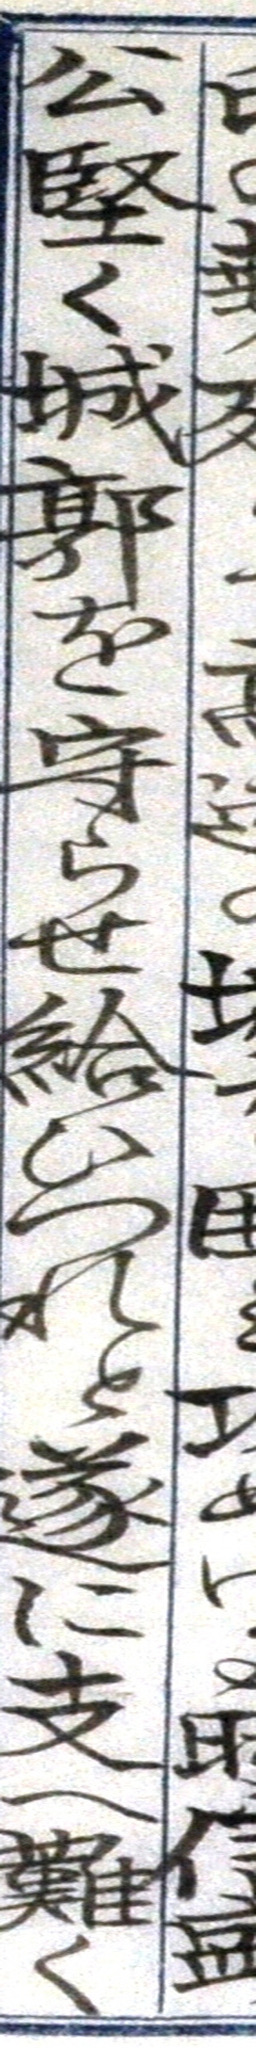公堅く城郭を守らせ給ひつれと遂に支へ難く
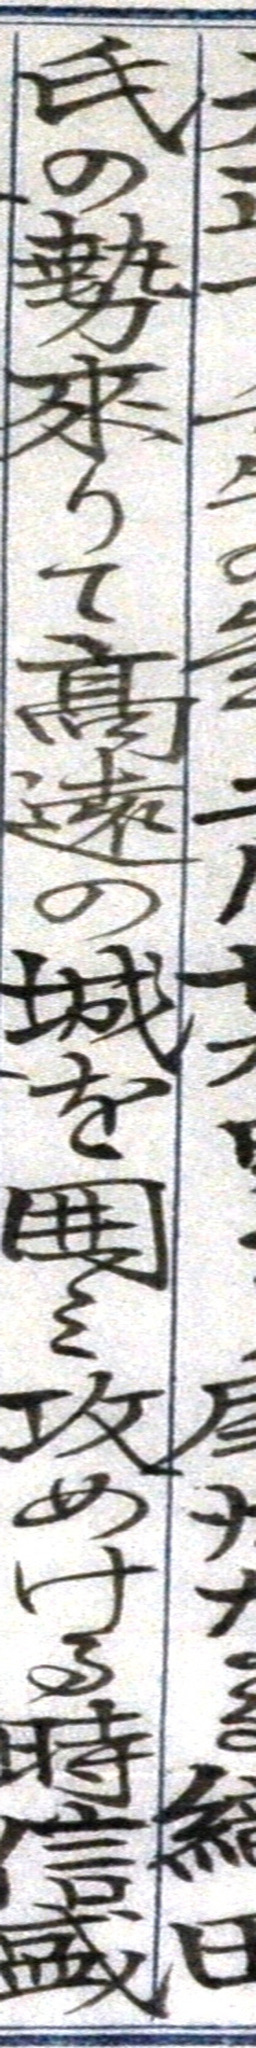氏の勢来りて高遠の城を囲ミ攻めける時信盛
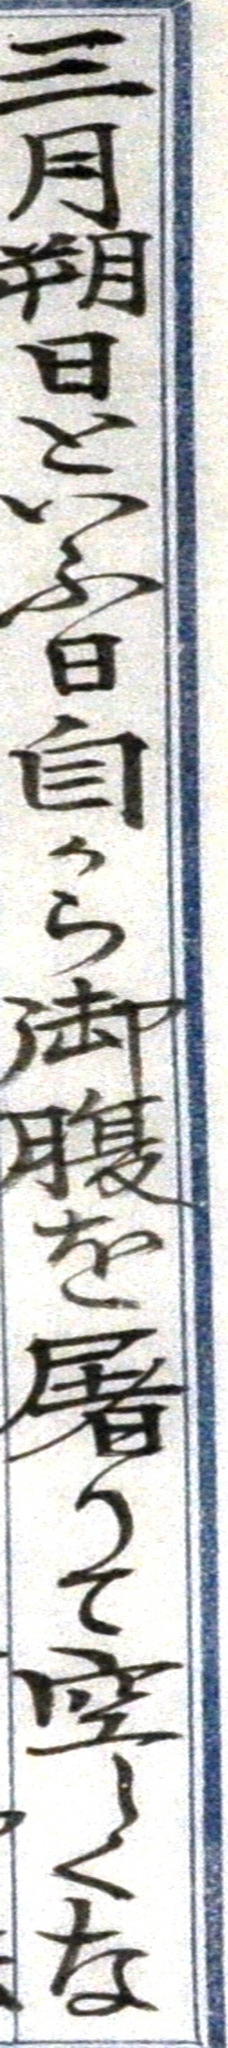三月朔日といふ日自から御腹を屠りて空しくな
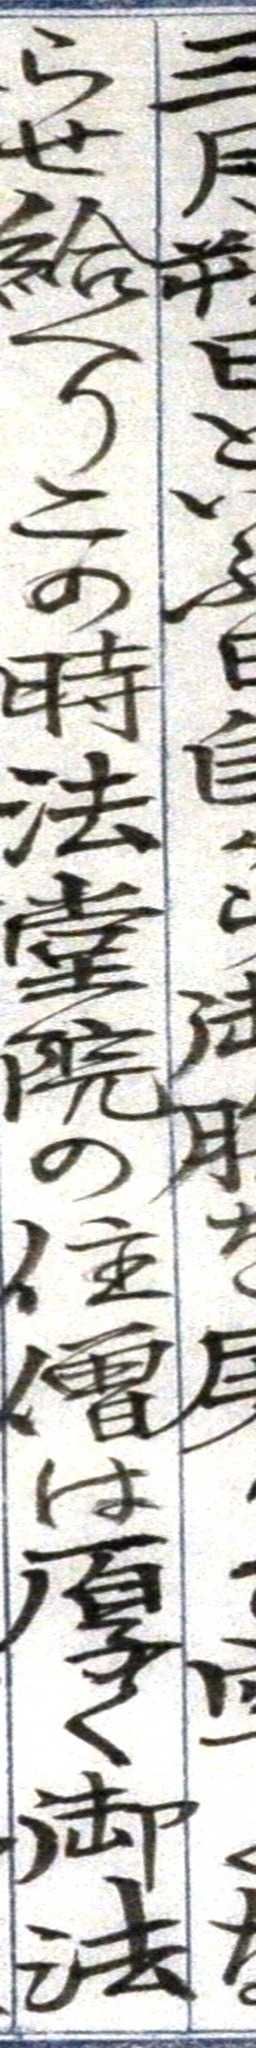らせ給へりこの時法堂院の住僧は厚く御法
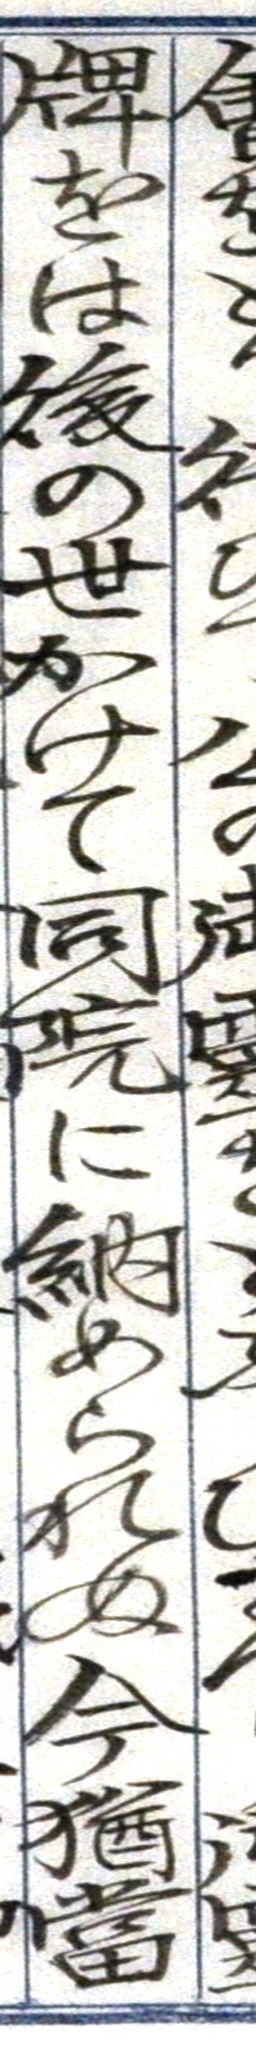牌をは後の世かけて同院に納められぬ今猶当
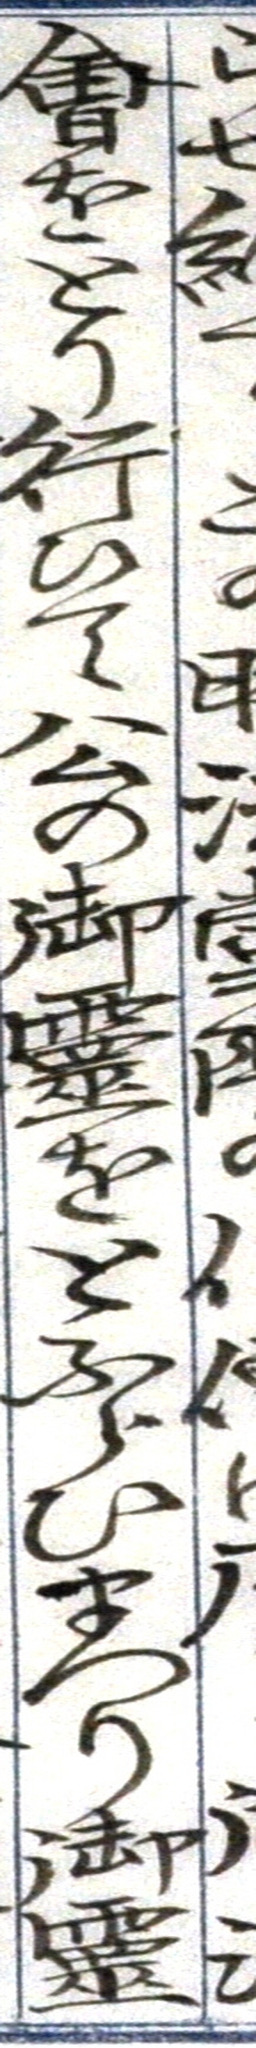会をとり行ひて公の御霊をとふらひまつり御霊
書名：桂泉院・樹林寺・東光寺縁起書、蓮華寺由来書、付夕顔観音記
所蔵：伊那市立高遠町図書館・合同会社AMANE
